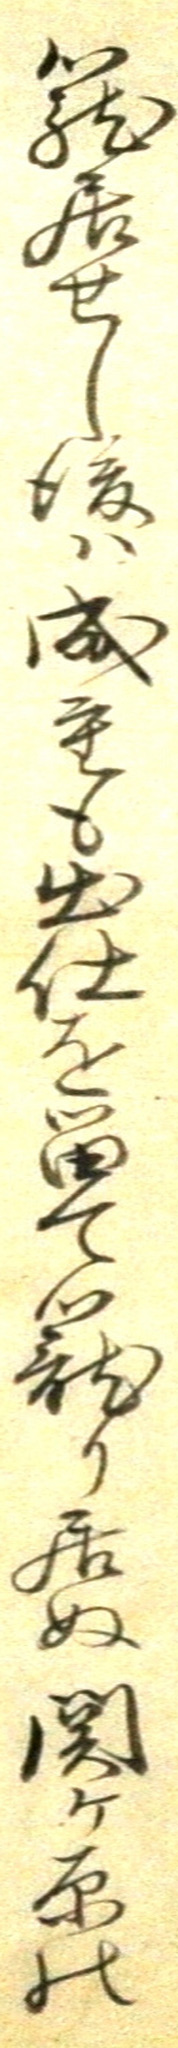籠居せし後は成重も出仕を留て籠り居ぬ関ヶ原の
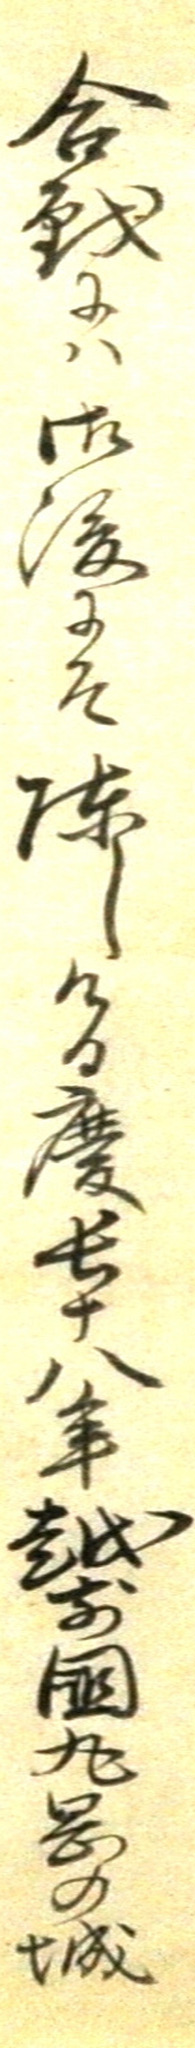合戦には御後にそ陣しける慶長十八年越前国丸岡の城
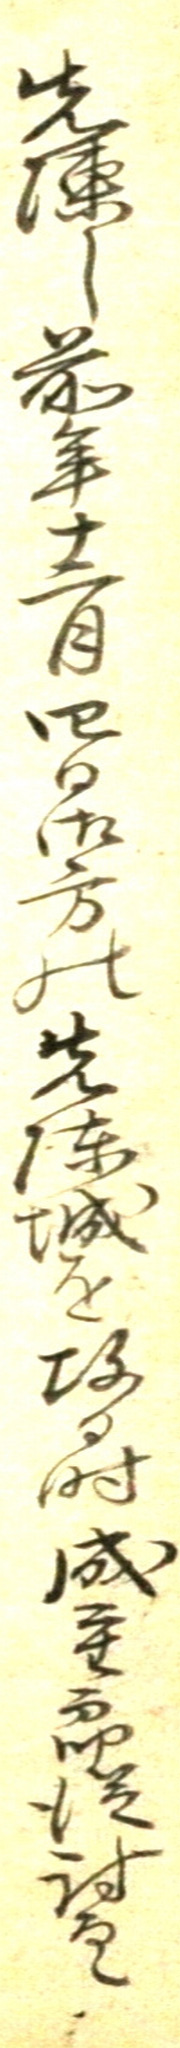先陣し前年十二月四日御方の先陣城を攻る時成重郎従討るゝ
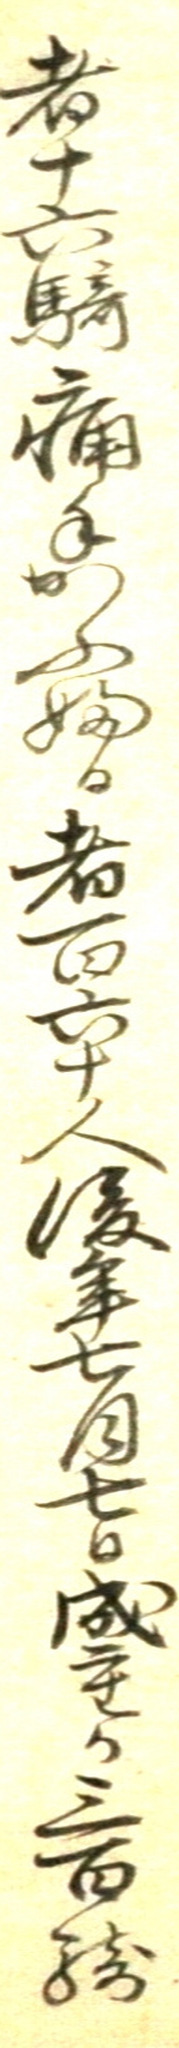者十六騎痛手かふふる者百六十人後年七月七日成重か三百騎
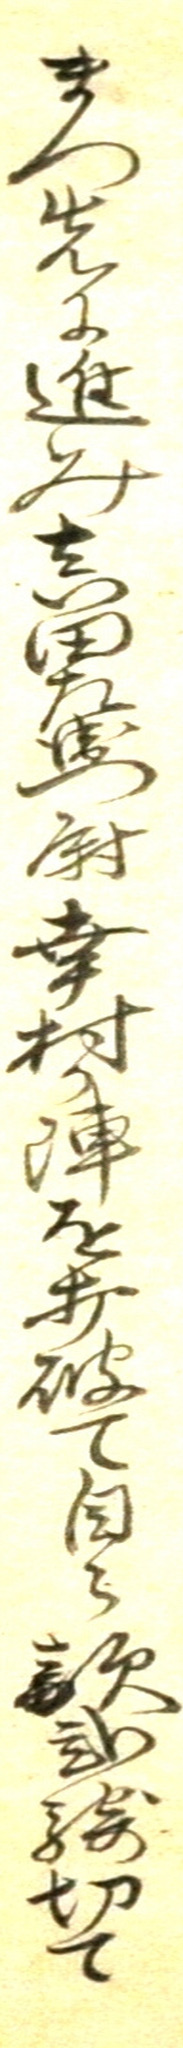まつ先に進み真田左衛門尉幸村か陣を打破て自ら敵弐騎切て
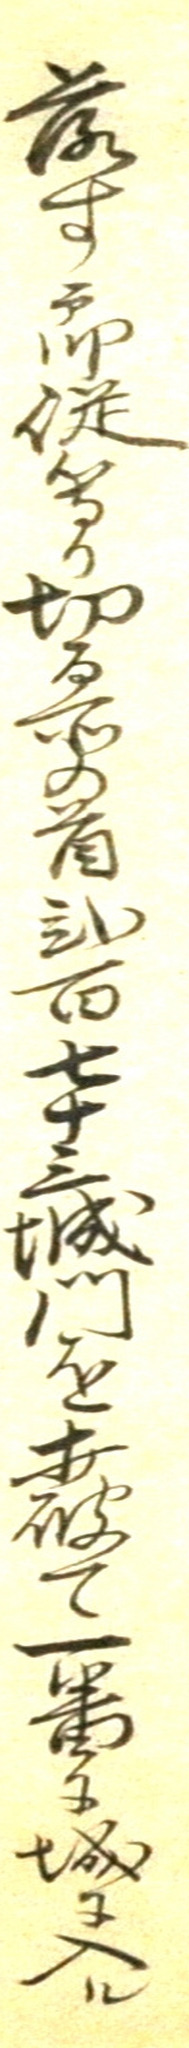落す郎従等か切る所の首弐百七十三城門を打破て一番に城に入ル
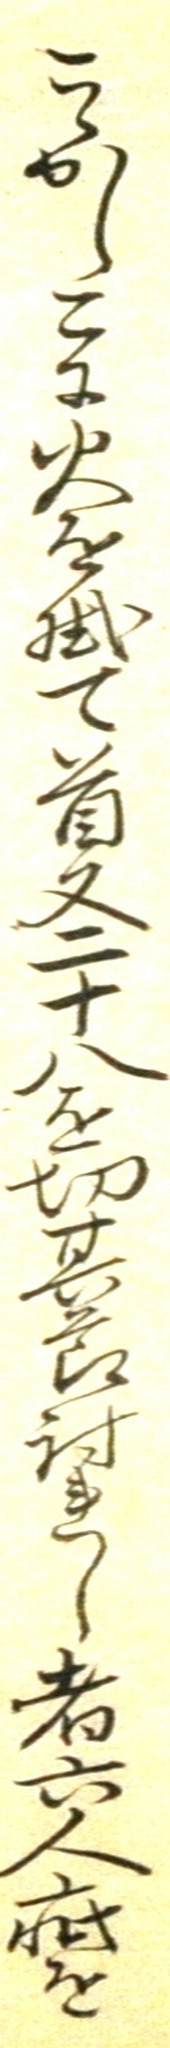こゝかしこに火を掛て首又二十八を切其節討れし者六人疵を
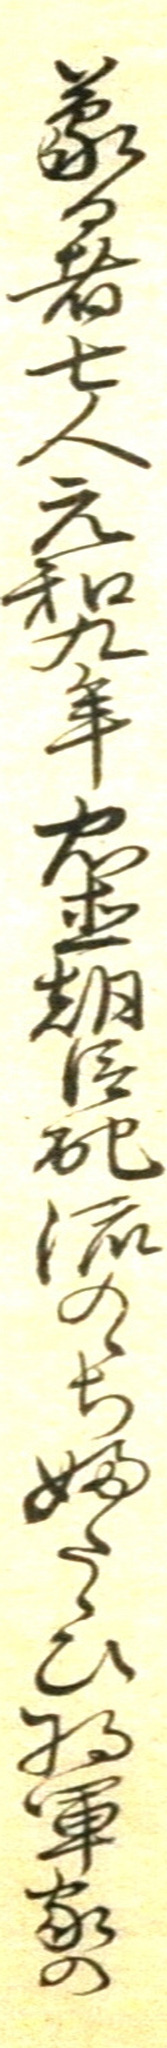蒙る者七人元和九年忠直朝臣配流のゝちふたゝひ将軍家の
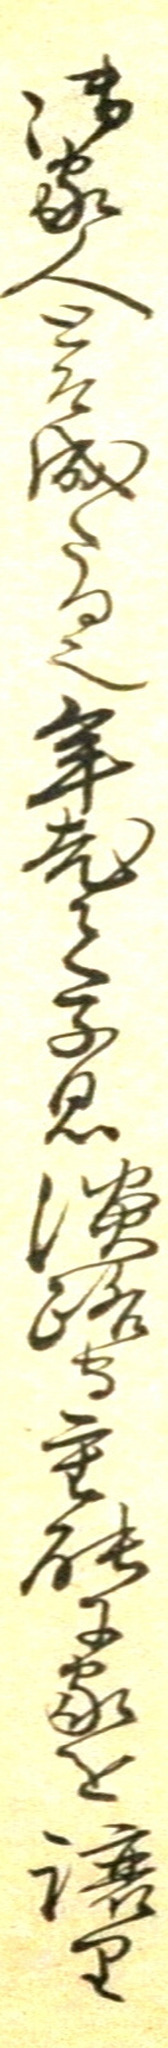御家人とそ成たる也年老て子息淡路守重能に家を譲り
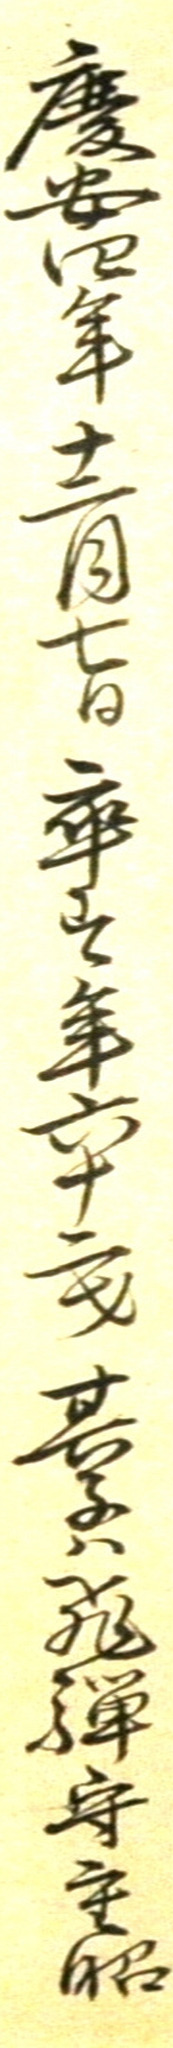慶安四年十二月七日卒す年六十二才其子は飛騨守重昭
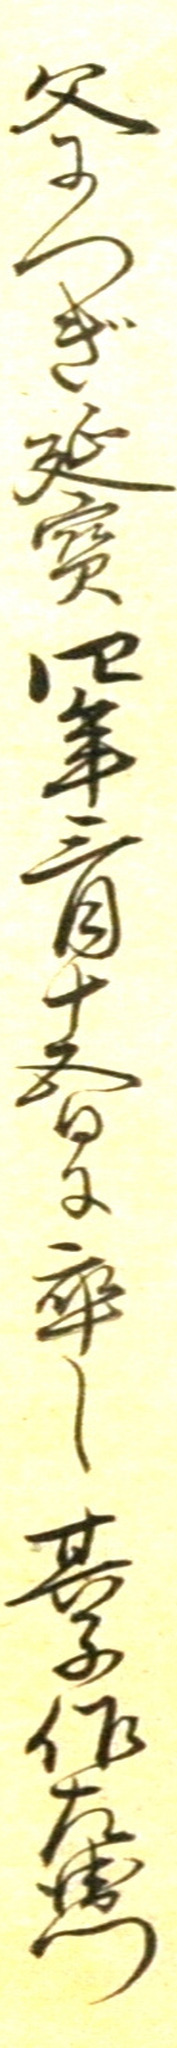父につぎ延宝四年三月十五日に卒し其子作左衛門

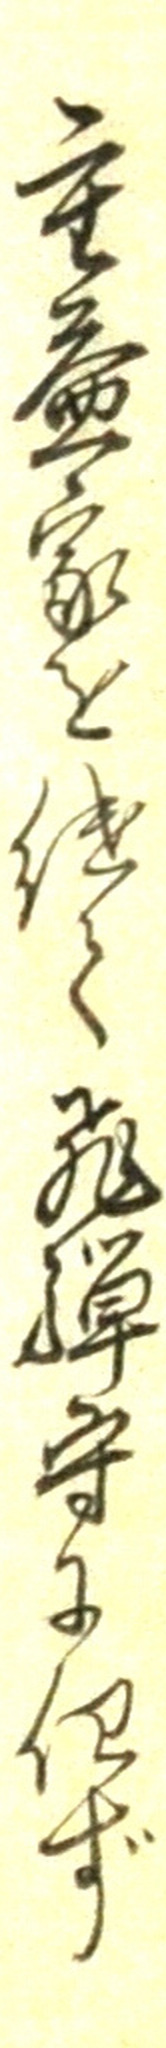重益家を継て飛騨守に任ず
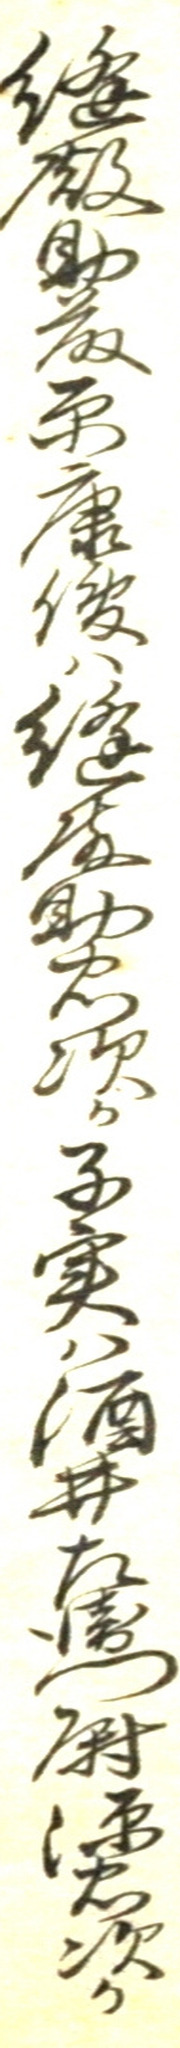縫殿助藤原康俊は縫殿助忠次か子実は酒井左衛門尉源忠次か
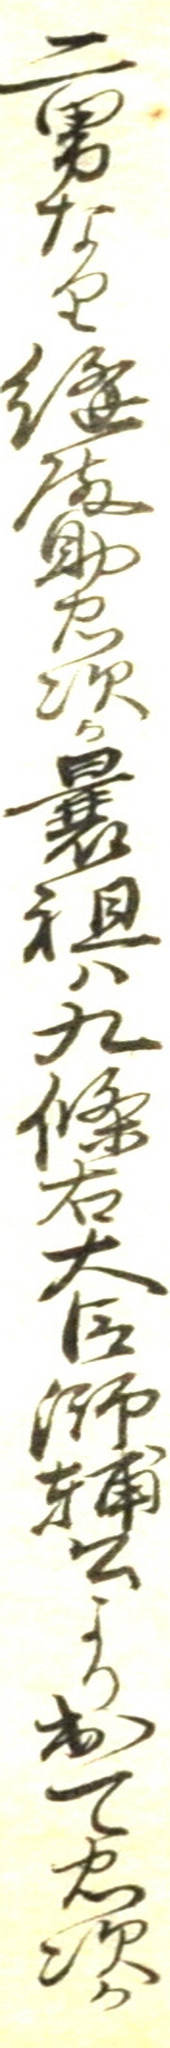二男なり縫殿助忠次か曩祖は九条右大臣師輔公より出て忠次か
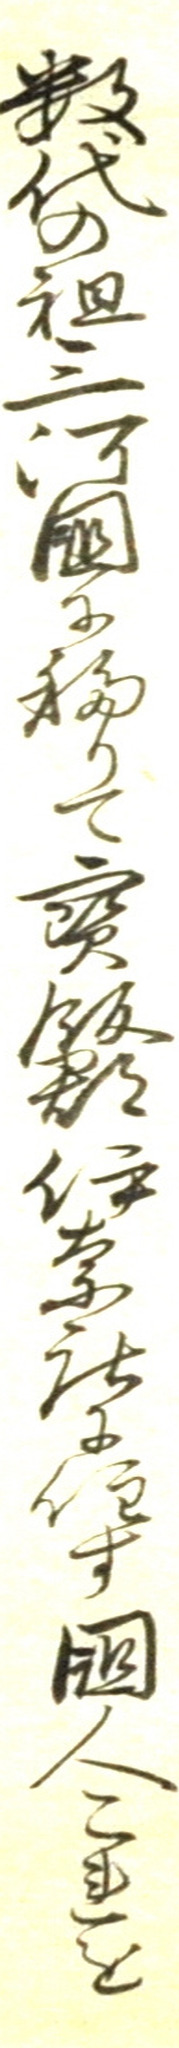数代の祖三河国に移りて宝飯郡伊奈庄に住す国人これを
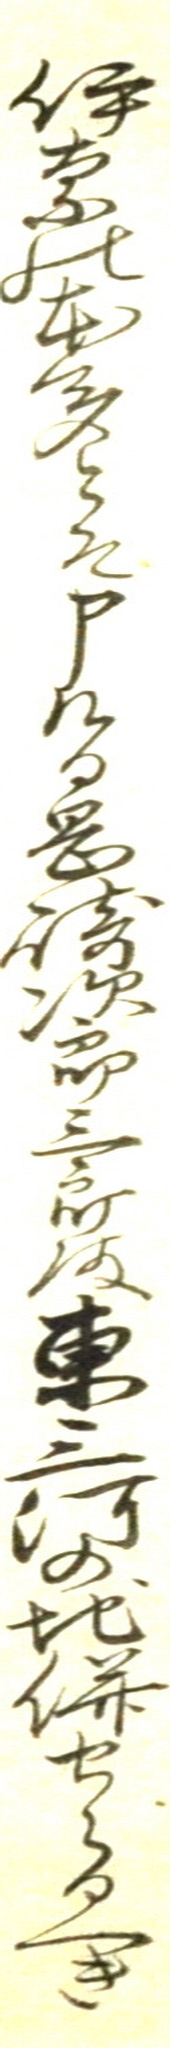伊奈の本多とそ申ける岡崎次郎三郎殿東三河の地併せらるへき
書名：藩翰譜（四・上）
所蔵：伊那市立高遠町図書館・合同会社AMANE
